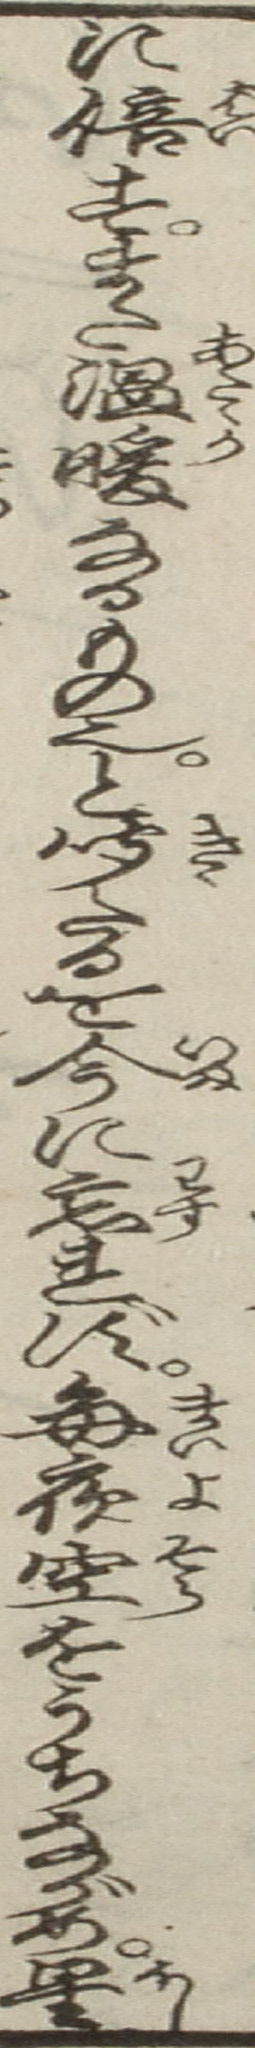に倍す。また温暖なるもの也。と聞たるを今に忘れず。毎夜空をうちながめ。星
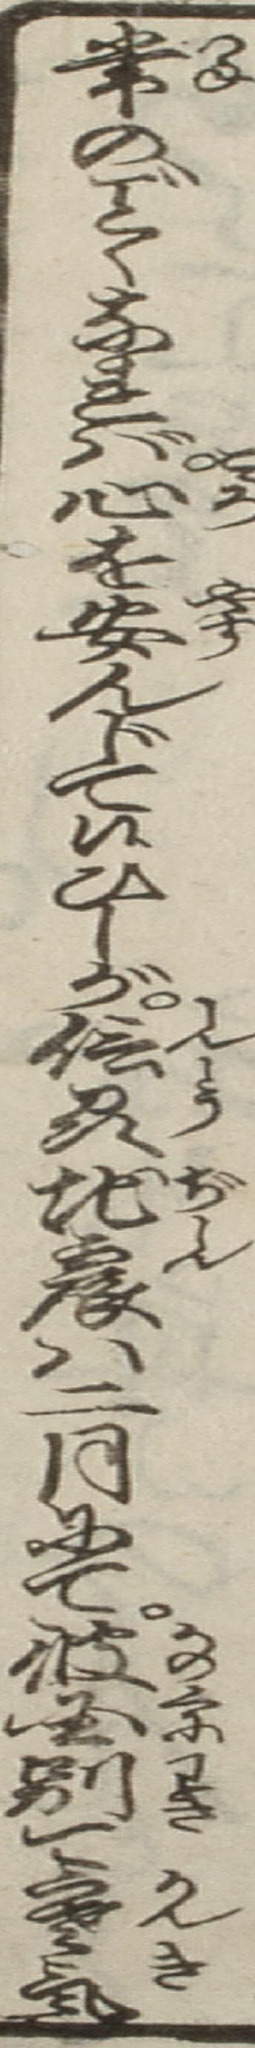常のごとくなれば。心を安んじて候ひしが。信州地震は二月にて。彼国別て寒気
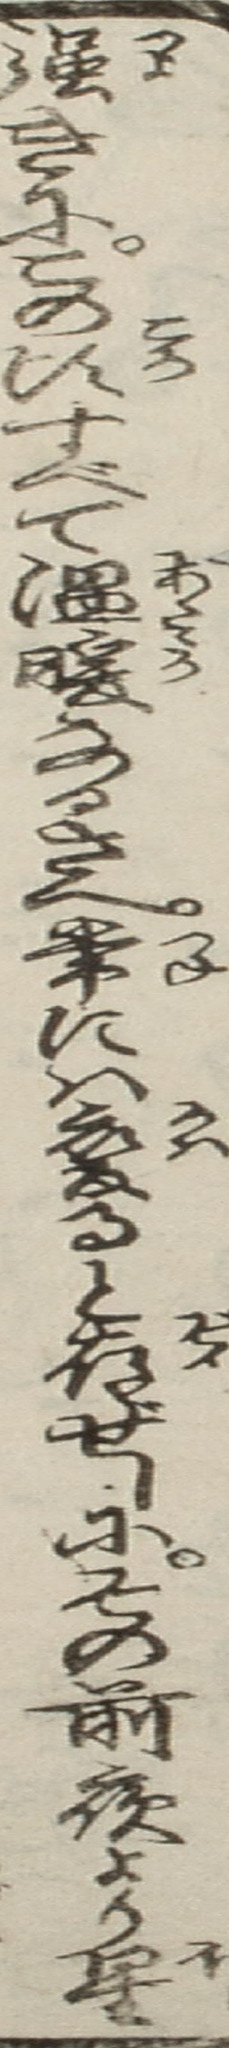強きに。この頃すべて温暖なるさへ。常には変ると存せしに。その前夜より星
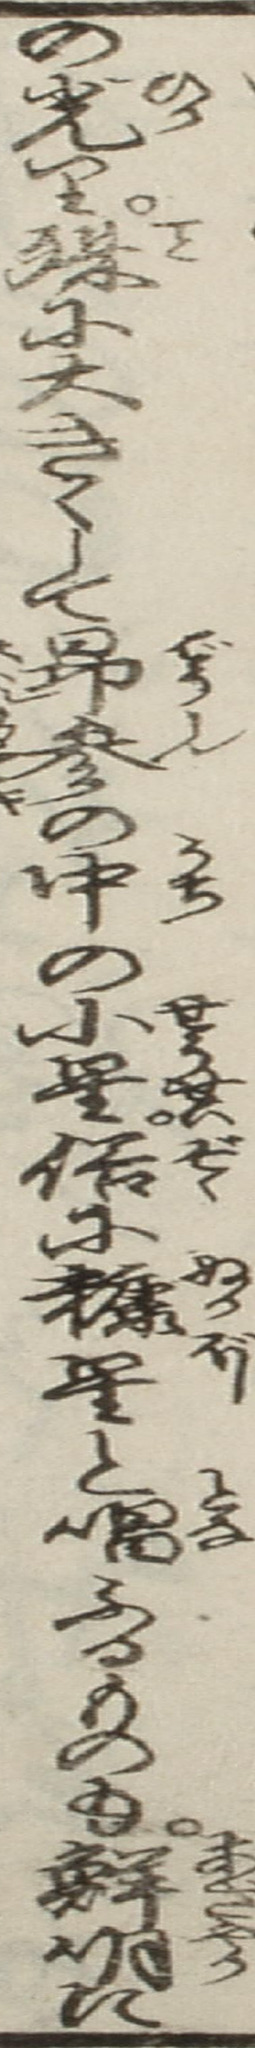の光り。殊に大きくして昻参の中の小星。俗に糠星と唱ふるものも。鮮明に
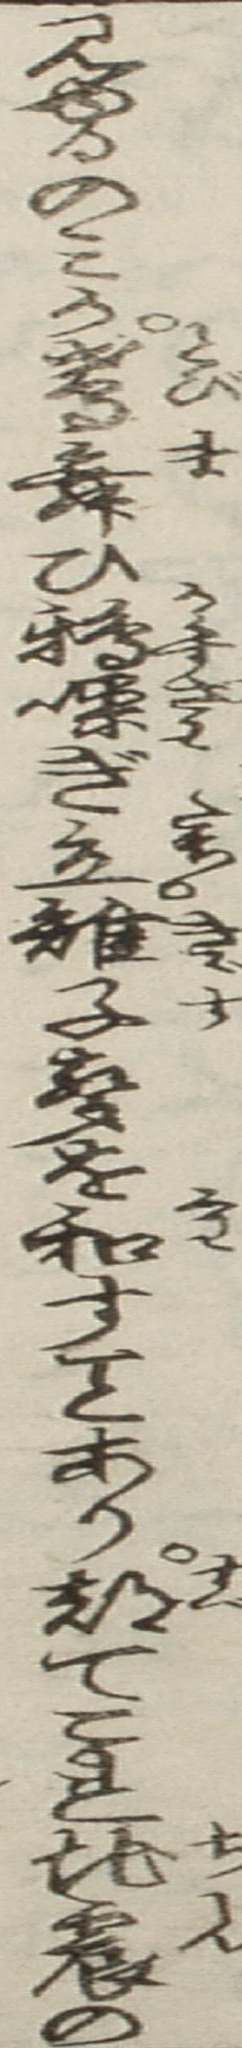見ゆるのみか。鳶舞ひ鴉噪ぎ立。雉子声を和すことあり。都てこれ地震の
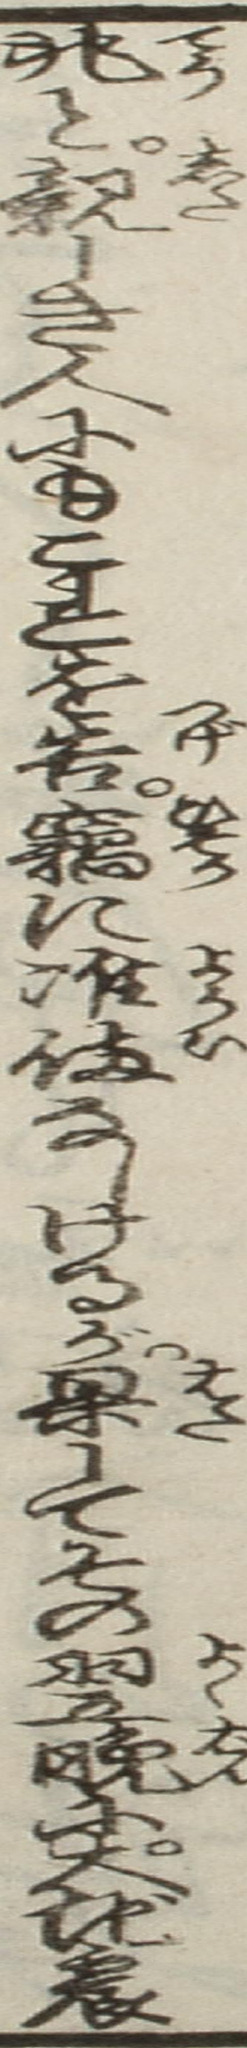兆と。親しき人にもこれを告。竊に准備なしけるが。果してその翌晩に。大地震
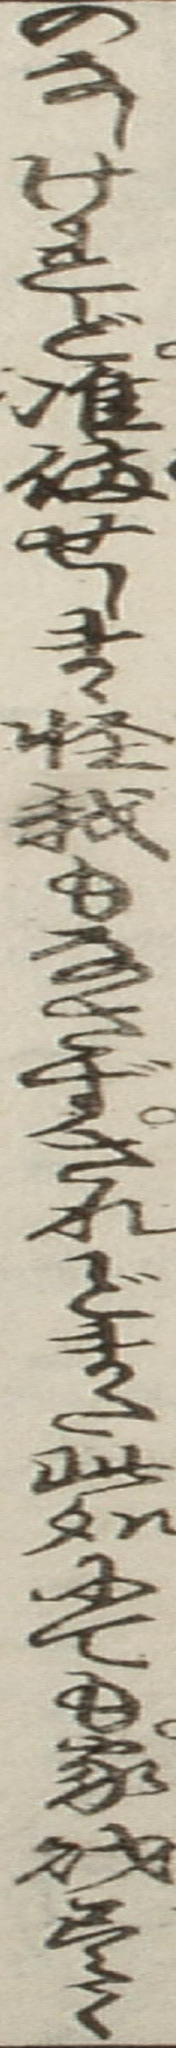のなしけれど。准備せしまゝ怪我もなさず。されどまた此処にても。家財尽々く
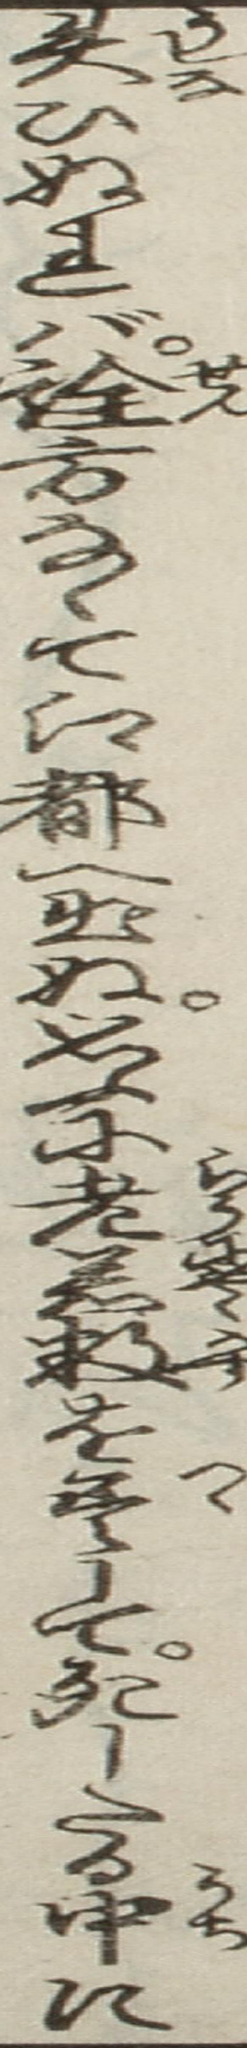失ひぬれば。詮方なくて江都へ出ぬ。思ふに老若数を尽して。死したる中に
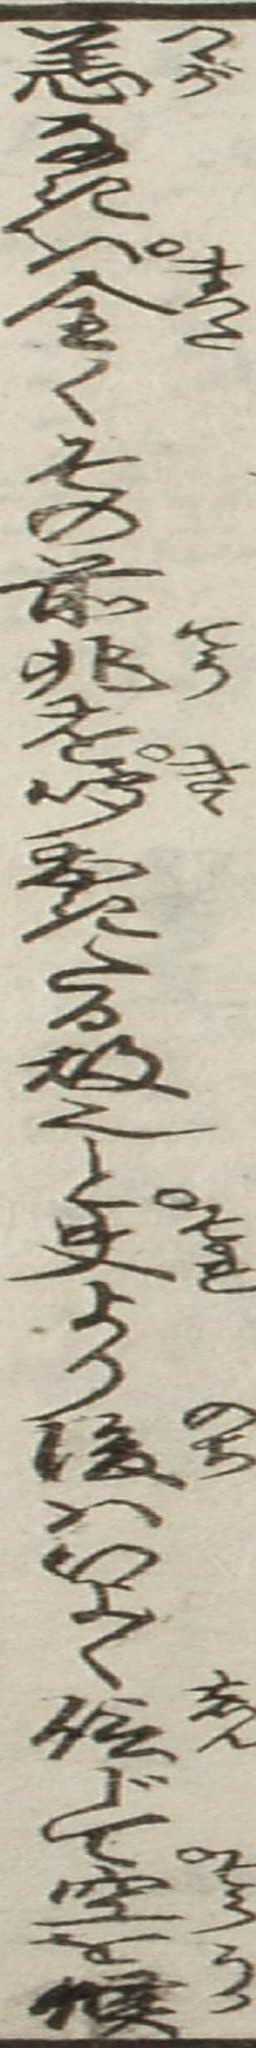恙なきは。全くその前兆を。聞おきたる故也と。夫より後はいよ〳〵信じて。空を候
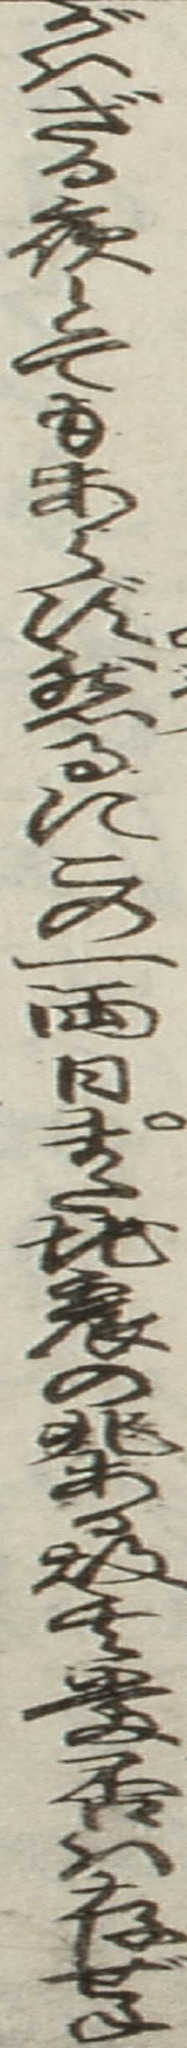がはざる夜とてもあらず。然るにこの一両日。また地震の兆ある故。其当否は存ぜね
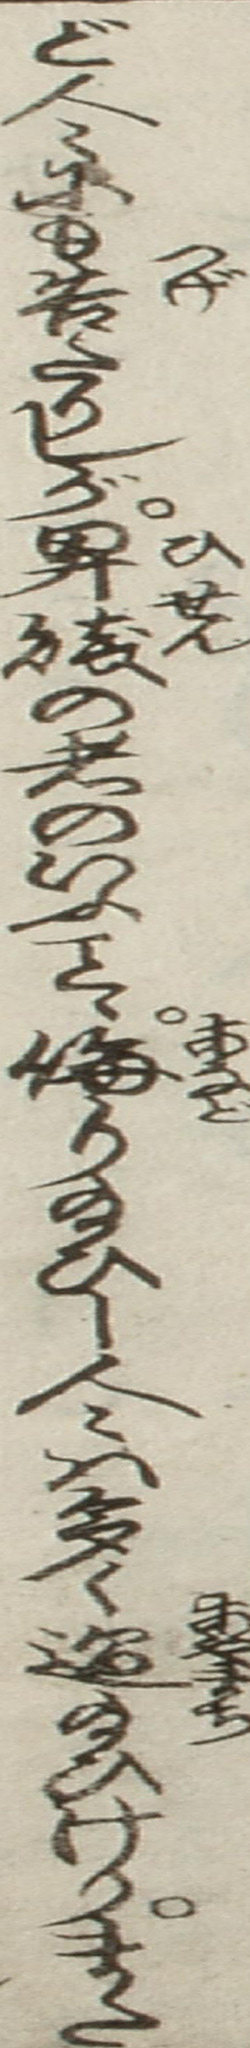ど人〻にも告たりしが。卑賤の者のいふことゝ。侮り給ひし人〻は多く過給ひけり。また
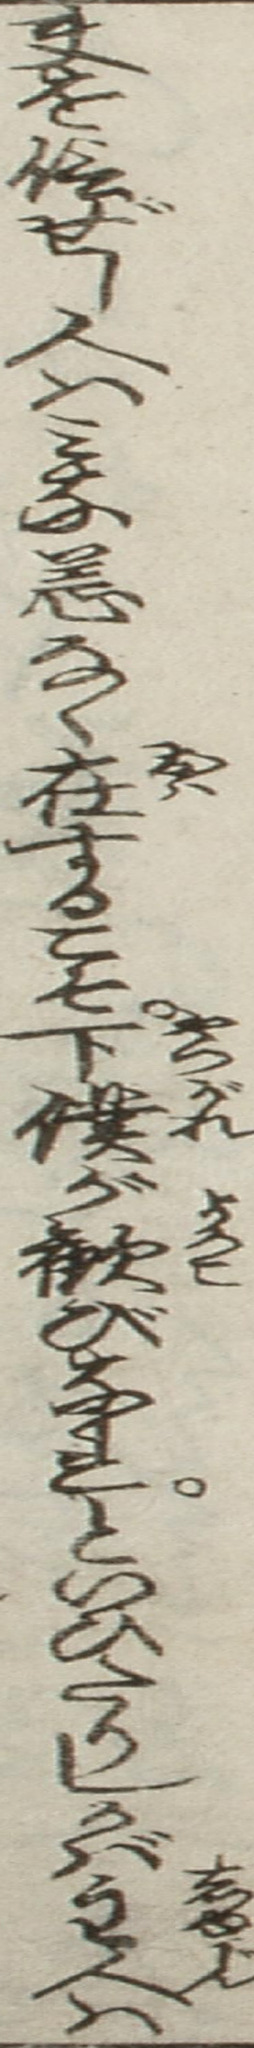夫を信ぜし人はみな恙なく在するこそ。下僕が歓びなれ。といひたりしかば主人は
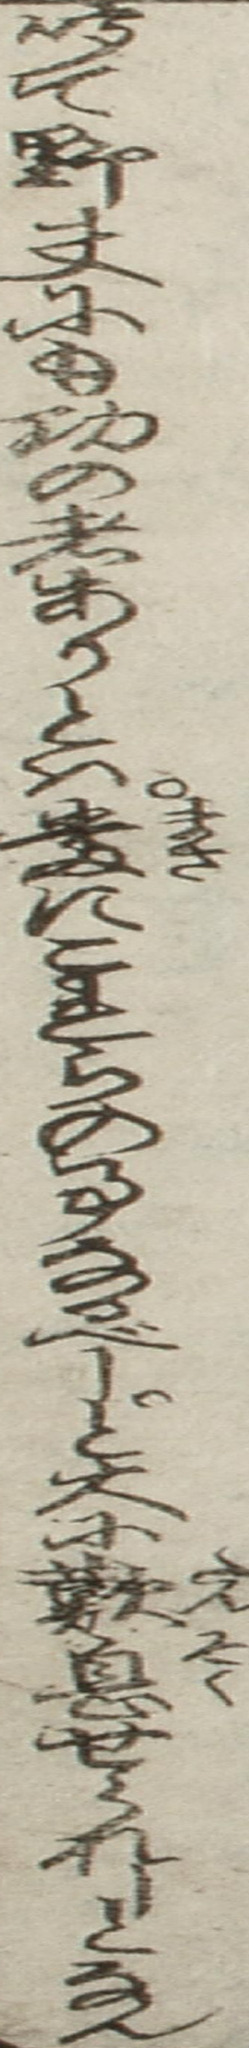聞て野夫にも功の者ありとは。当にこれらの事なるべし。と大に歎息せられしとなん

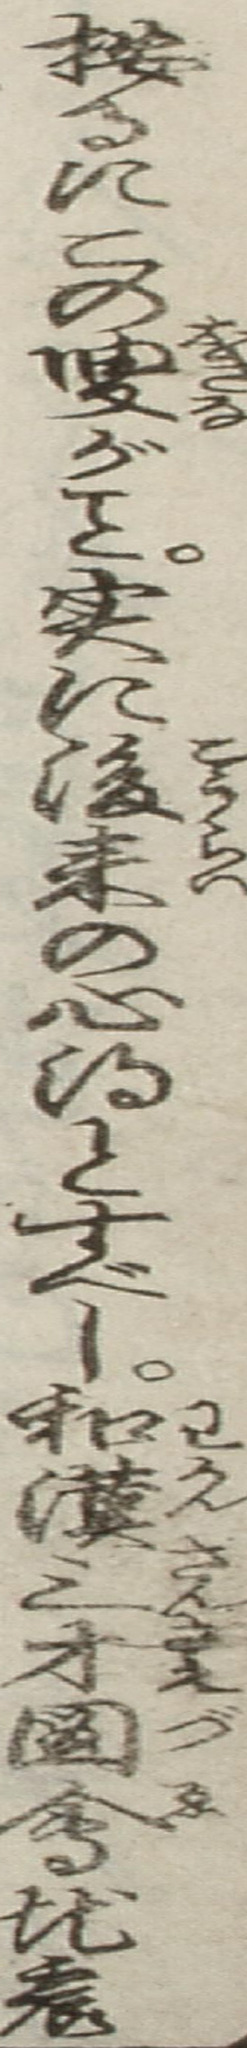按るにこの叟がこと。実に後来の心得とすべし。和漢三才図会地震
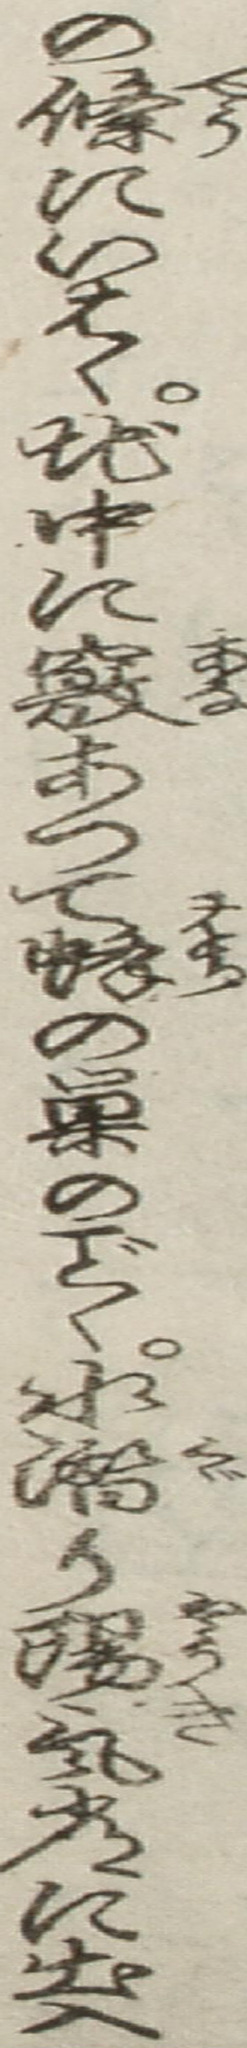の條にいはく。地中に竅あつて蜂の巣のごとく。水潜り陽気常に出入
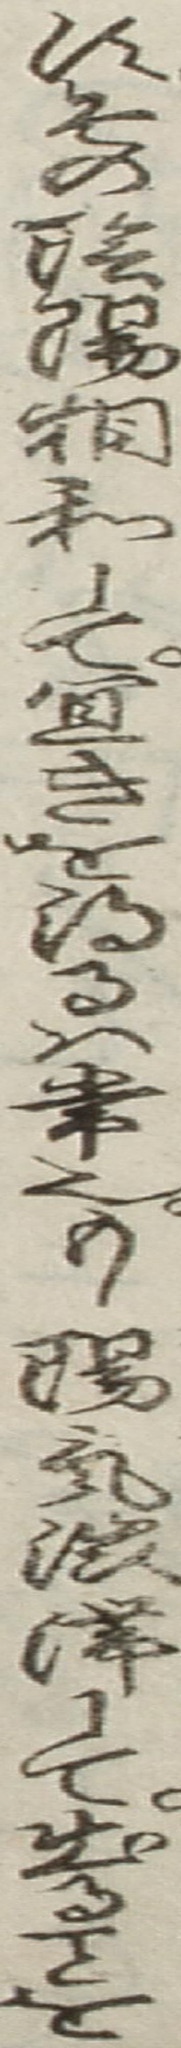す。その陰陽相和して。宜きを得るは常也。もし陽気渋滞して。出ることを
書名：安政見聞録　上
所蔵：東京大学地震研究所図書室 Earthquake Research Institute Library, The University of Tokyo, JAPAN
